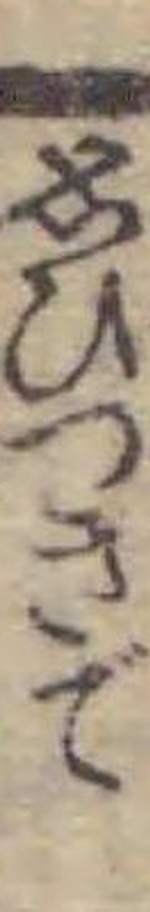思ひつきで
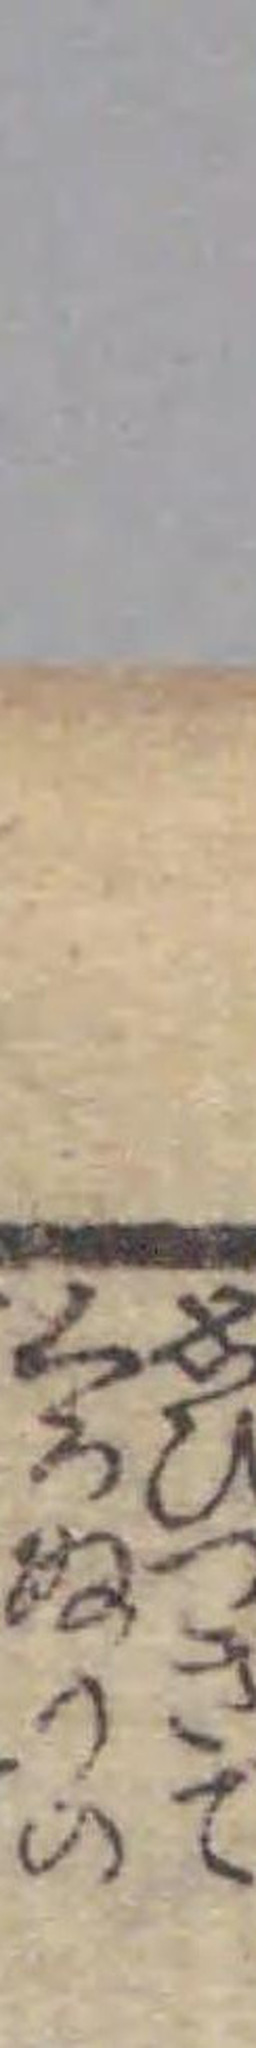くろぬりの
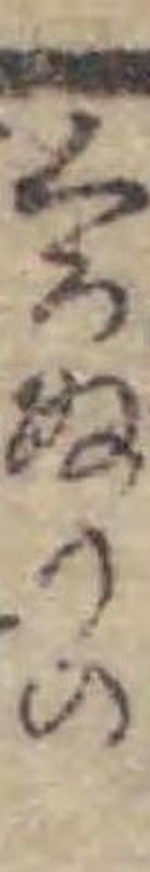くろぬりの
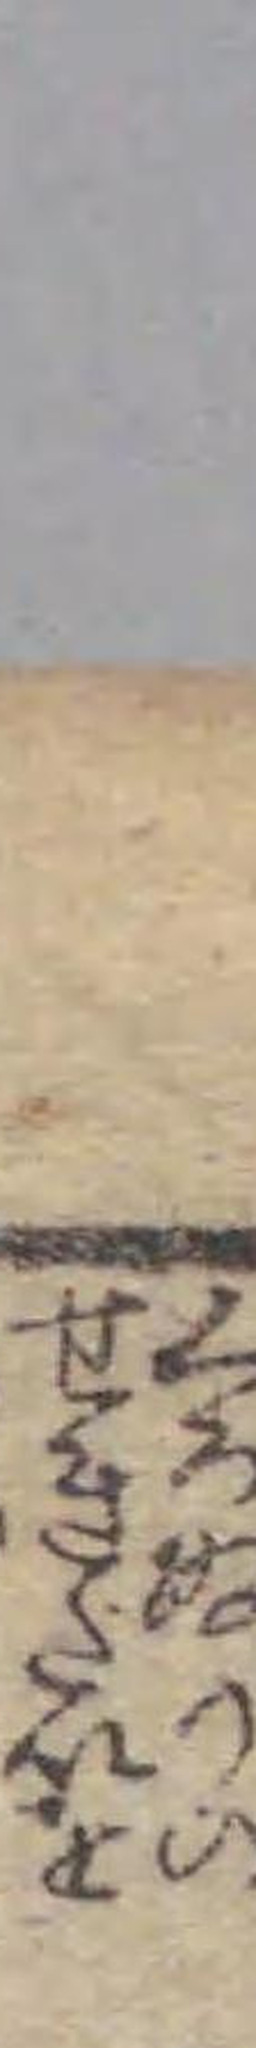せきだいを
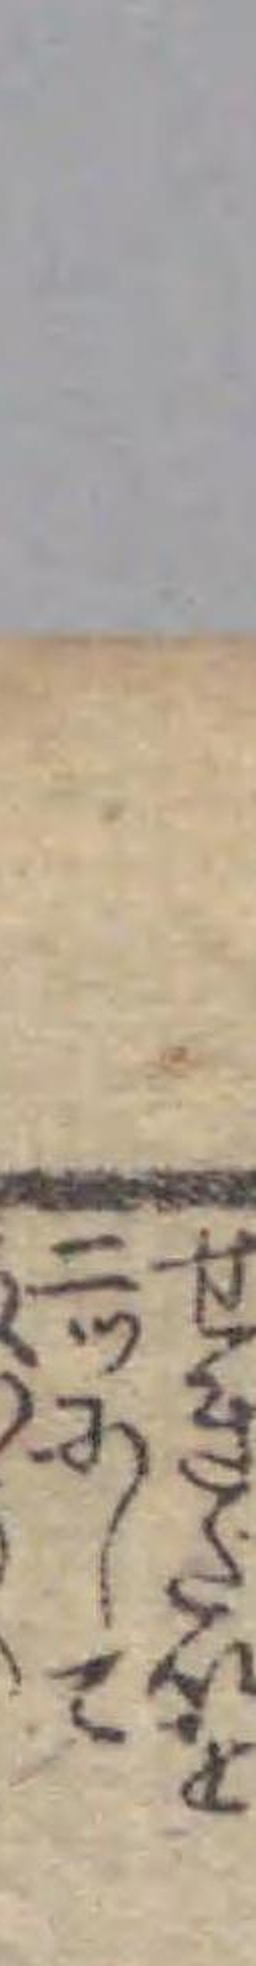二つにして
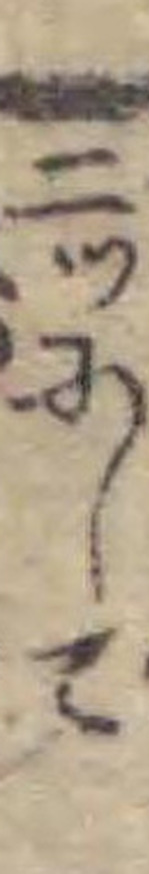二つにして
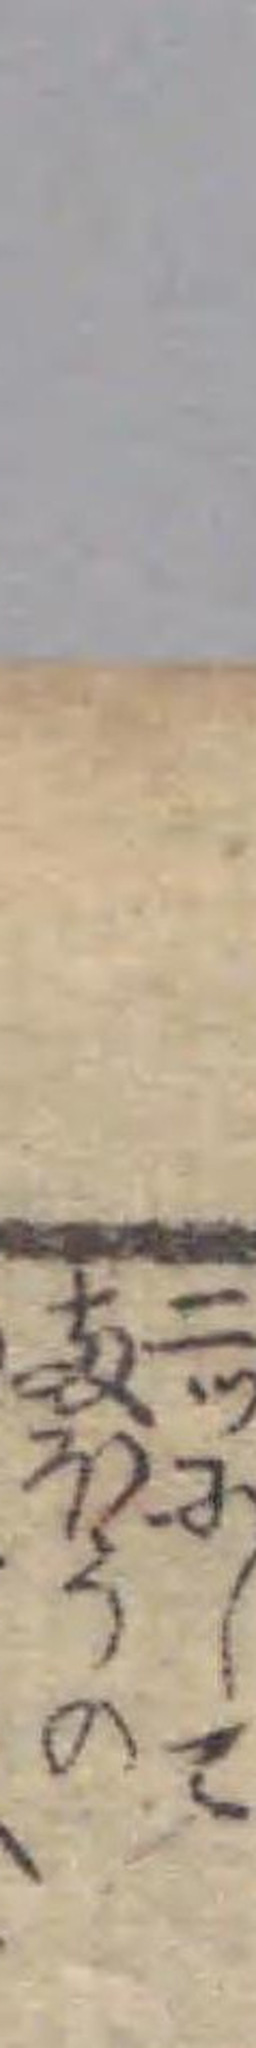両ほうの
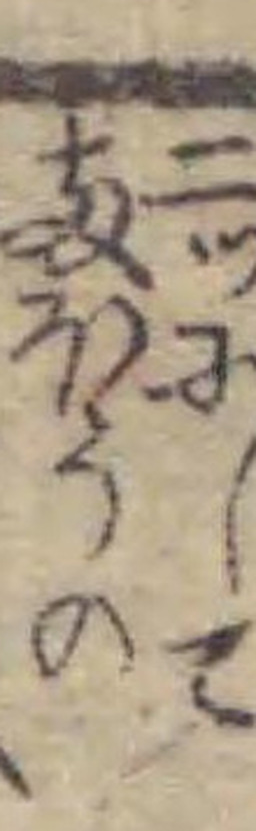両ほうの
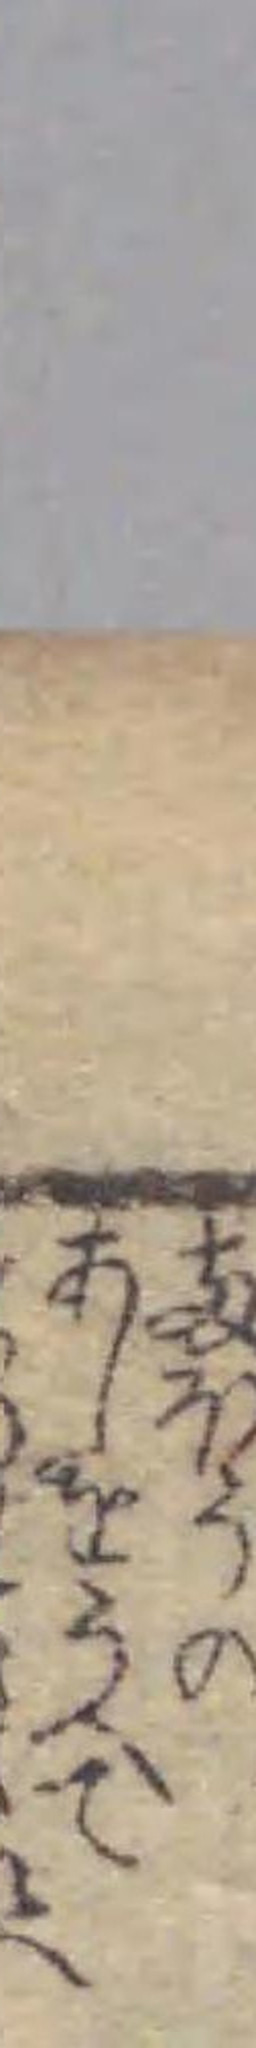あしをうへて
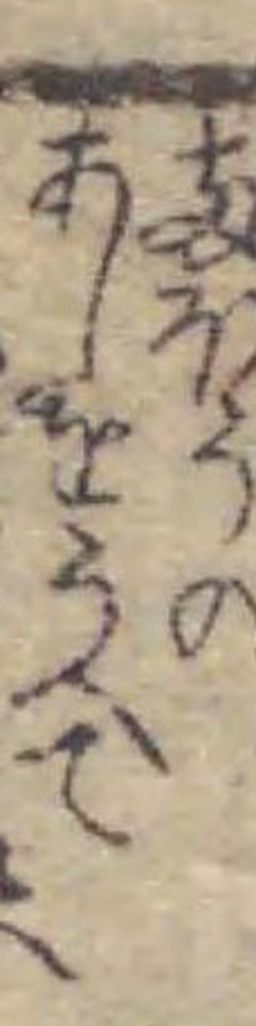あしをうへて
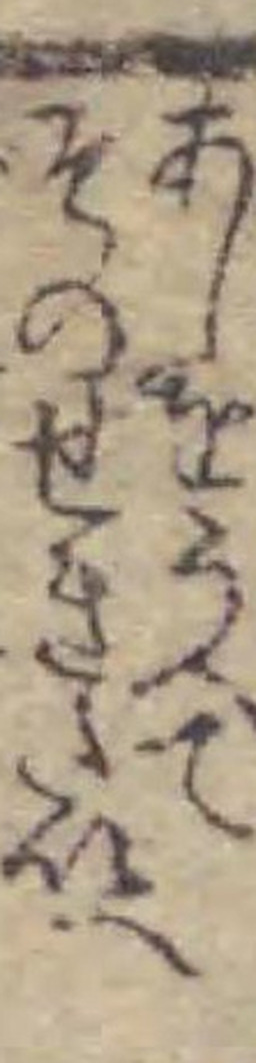そのせきたいへ
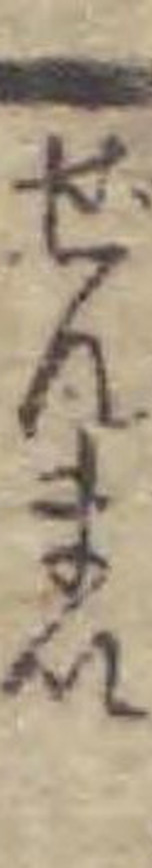ぜんまい
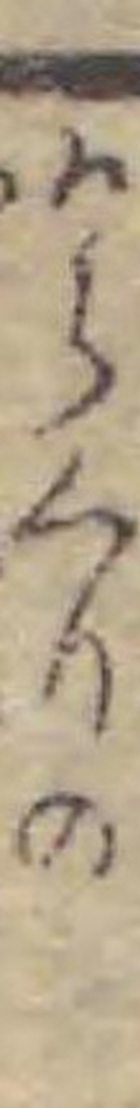からくりの
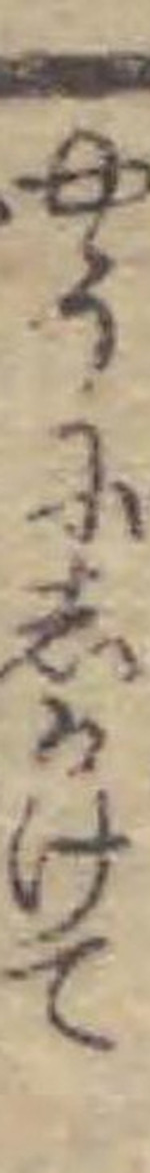やうにしかけて
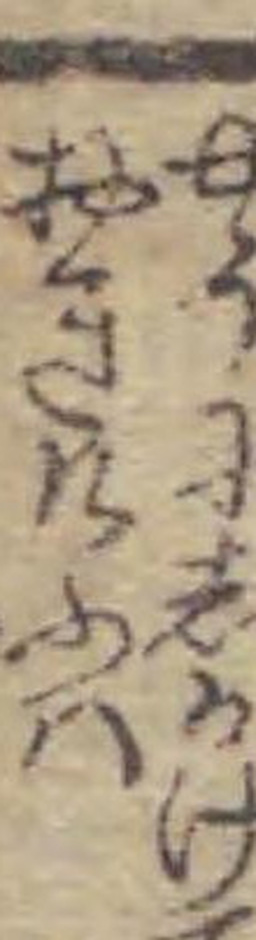おきけふは
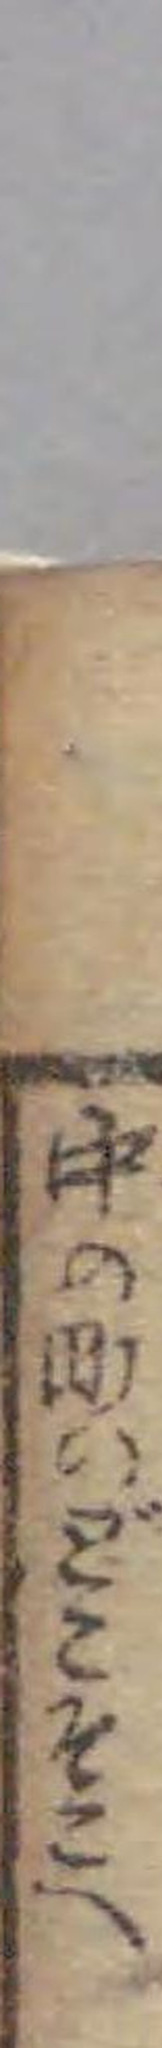中の町のどこそこへ
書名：奇妙頂礼胎錫杖 : 3巻
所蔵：国立国会図書館 National Diet Library, JAPAN
